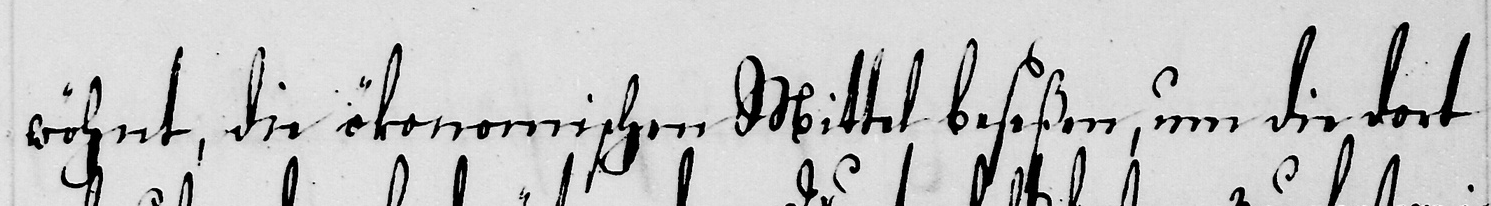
wöhnt, die ökonomischen Mittel beseßen, um die dort
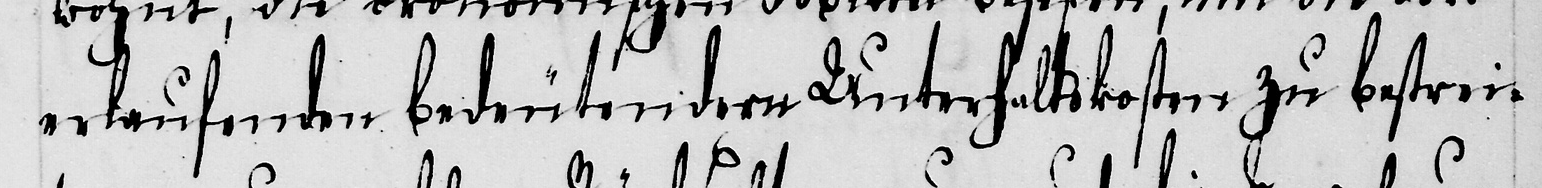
erlaufenden bedeutendern Unterhaltskosten zu bestrei¬
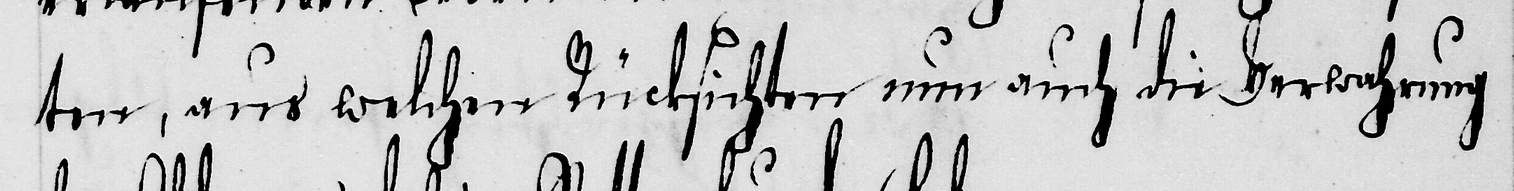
ten, aus welchen Rücksichten nun auch die Verwahrung
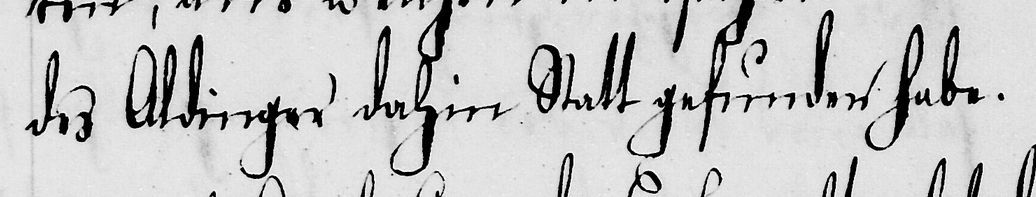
des Aldinger dahin Statt gefunden habe.
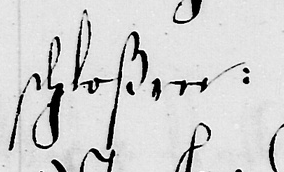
schloßen:
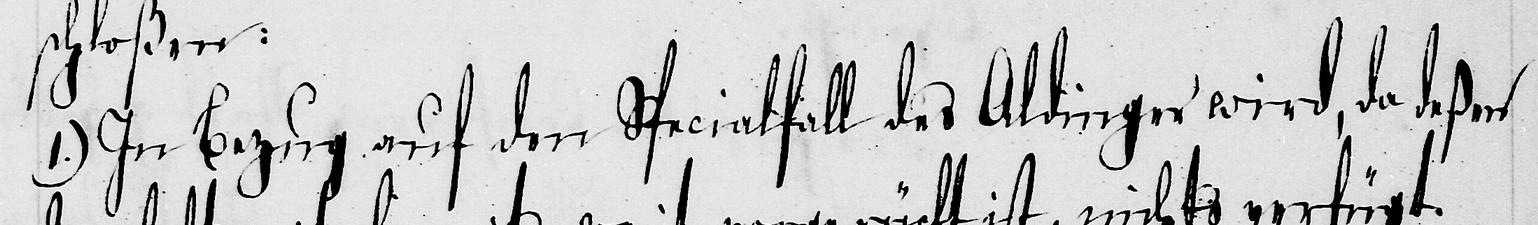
1.) In Bezug auf den Specialfall des Aldinger wird, da deßen
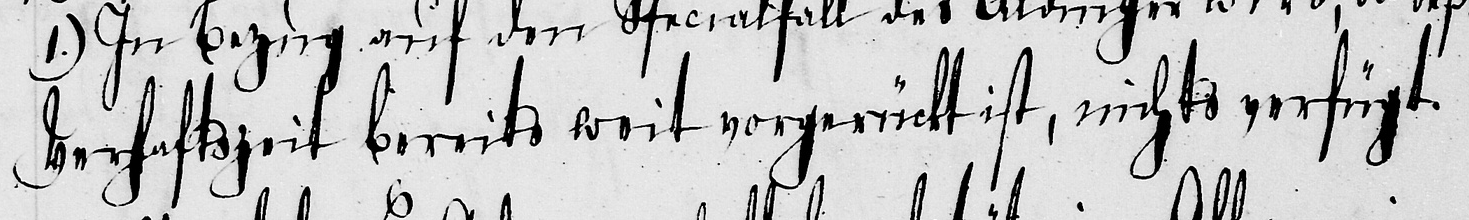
Verhaftszeit bereits weit vorgerückt ist, nichts verfügt.
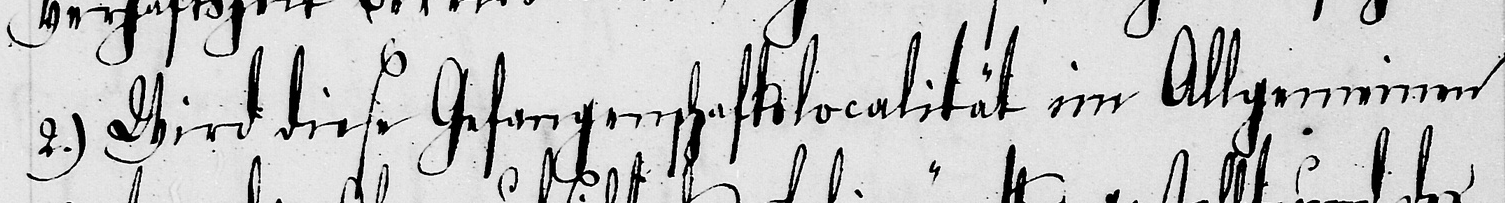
2.) Wird diese Gefangenschaftslocalität im Allgemeinen
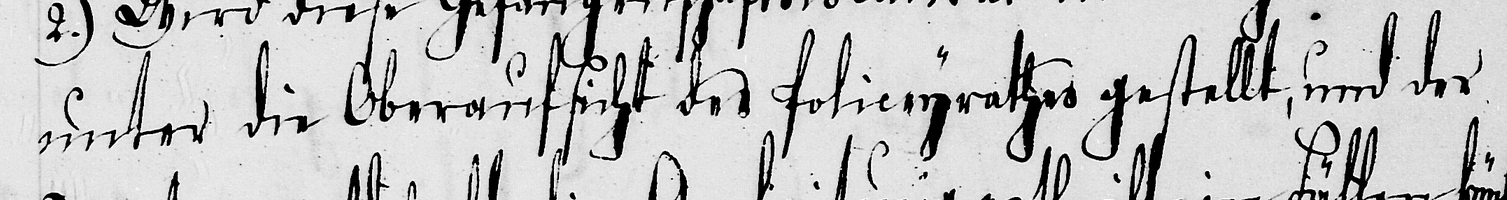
unter die Oberaufsicht des Policeyrathes gestellt, und der
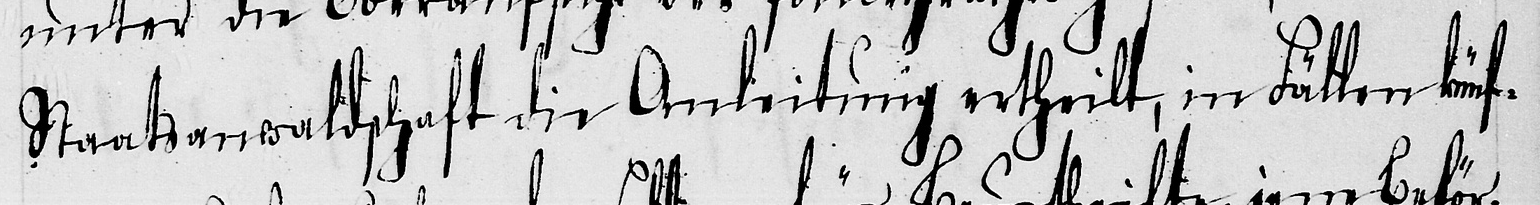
Staatsanwaltschaft die Anleitung ertheilt, in Fällen künf¬
